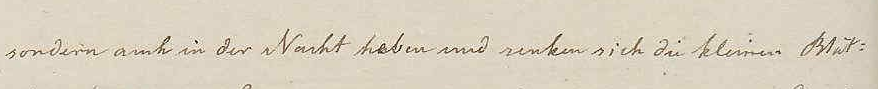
sondern auch in der Nacht haeben und senken sich die kleinen Blät-
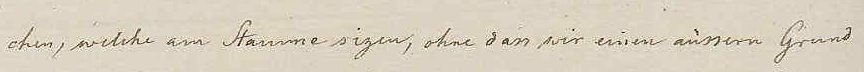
chen, welche am Stamme sizen, ohne dass wir einen äussern Grund
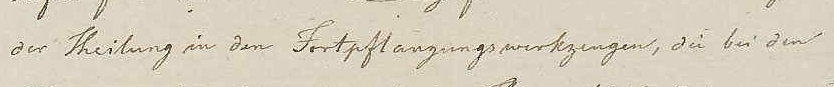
der Theilung in den Fortpflanzungswerkzeugen, die bei den
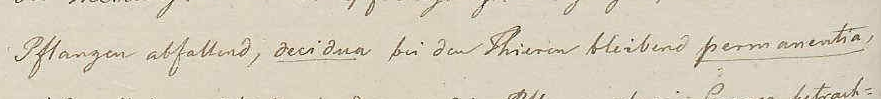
Pflanzen abfallend, decidua bei den Thieren bleibend permanentia,
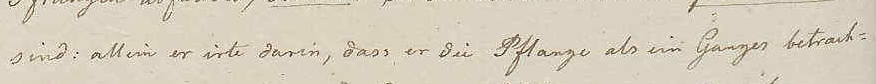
sind: allein er irte darin, dass er die Pflanze als ein Ganzes betrach-
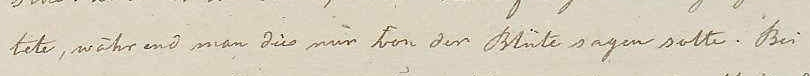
tete, während man dies nur von der Blüte sagen solte. Bei
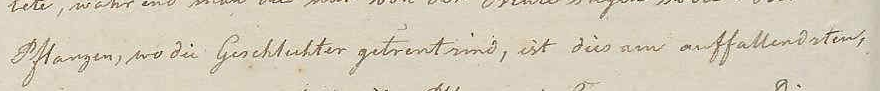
Pflanzen, wo die Geschlechter getrent sind, ist dies am auffallendsten,
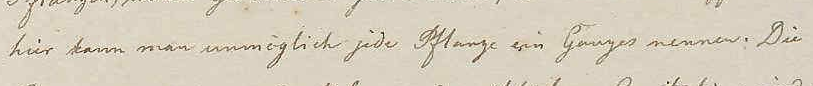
hier kann man unmöglich jede Pflanze ein Ganzes nennen. Die
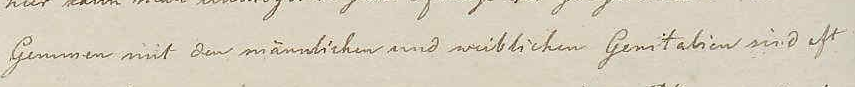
Gemmen mit den männlichen und weiblichen Genitalien sind oft
